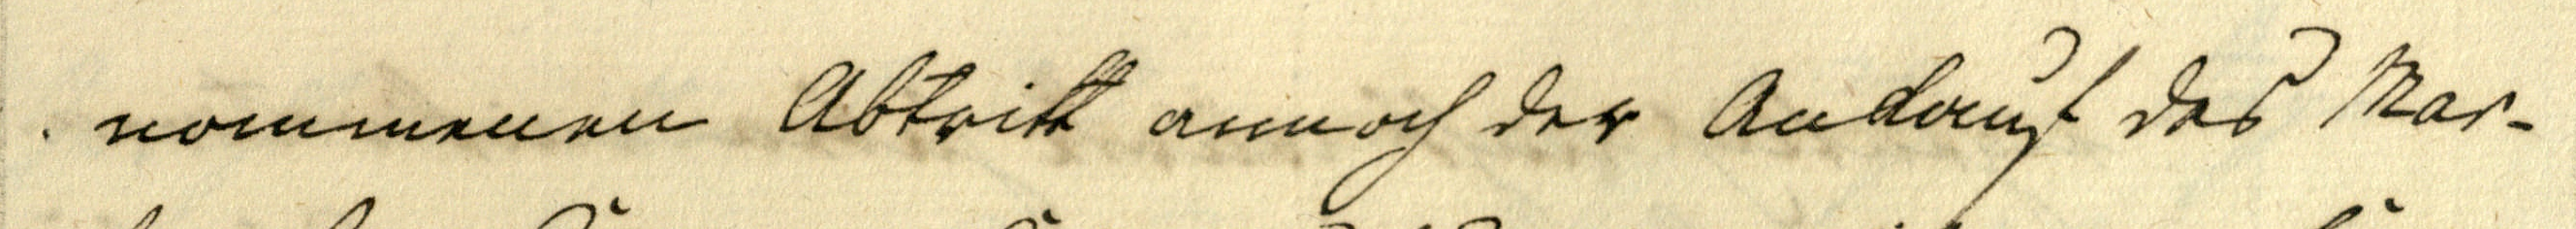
nommenen Abtritt annoch der Ankauf des Mar-
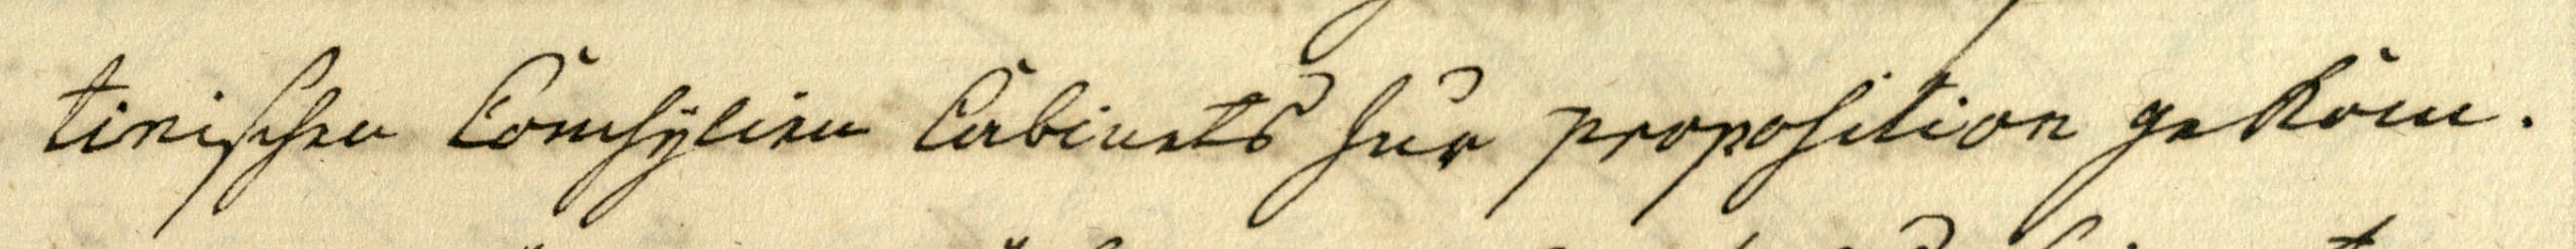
tinischen Conchylien Cabinets zur proposition gekom-
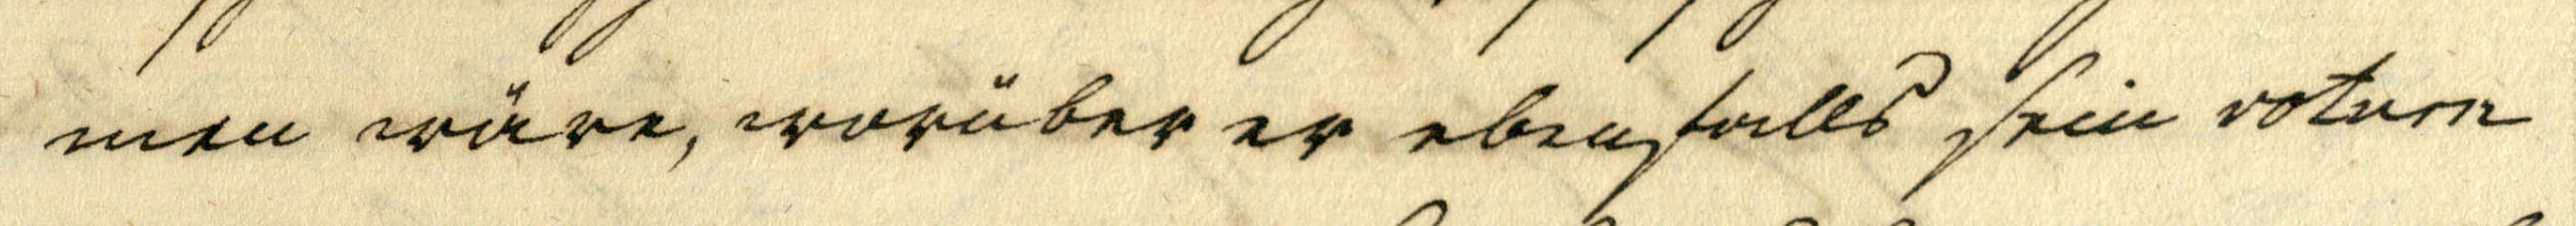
men wäre, worüber er ebenfalls ein votum
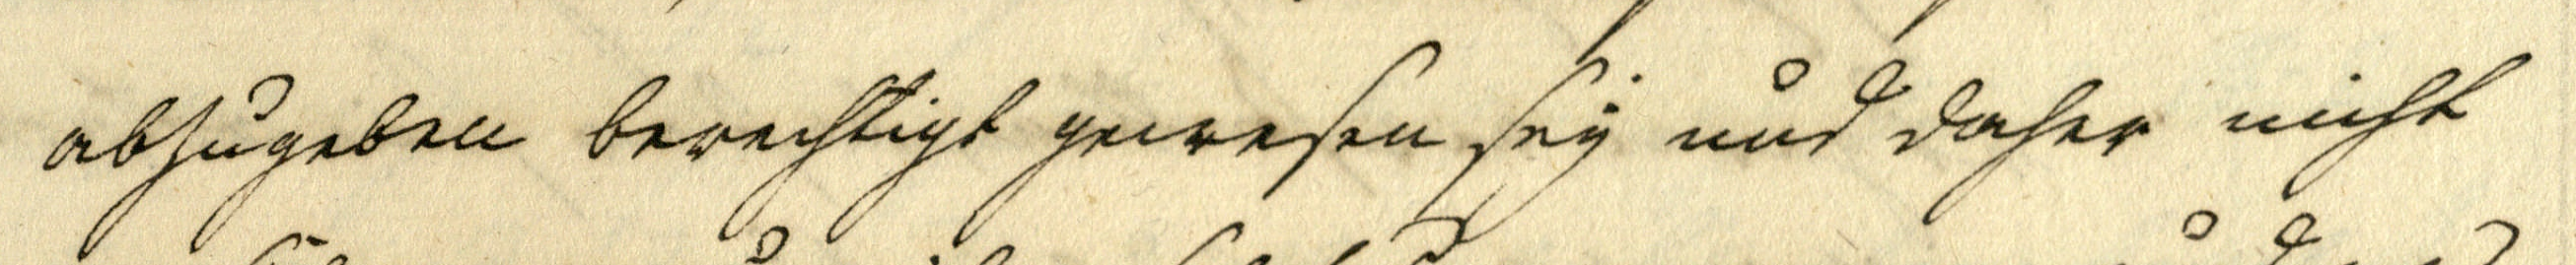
abzugeben berechtigt gewesen sey und daher nicht
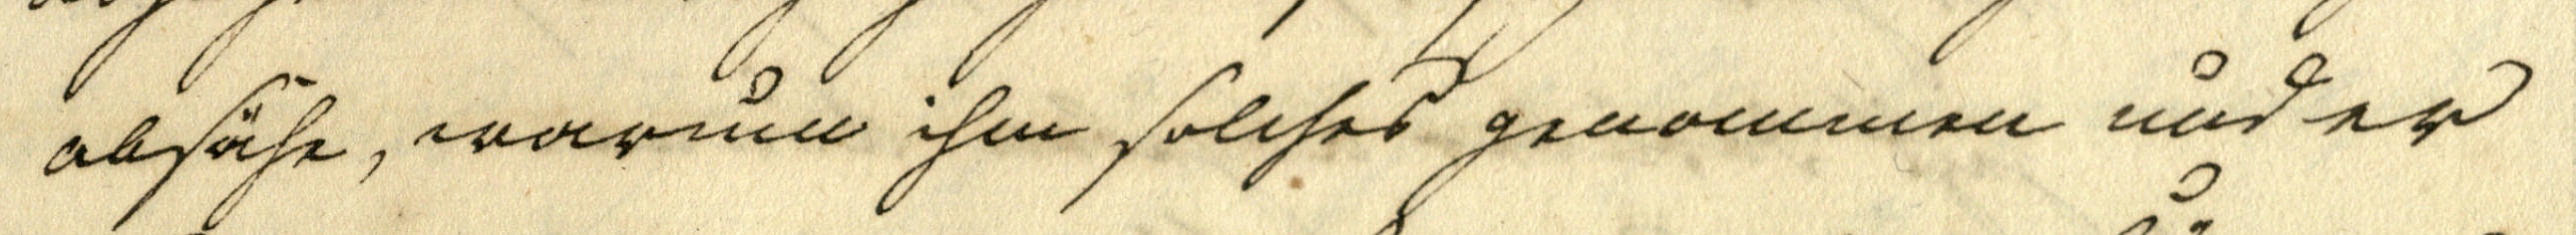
absähe, warum ihm solches genommen und er
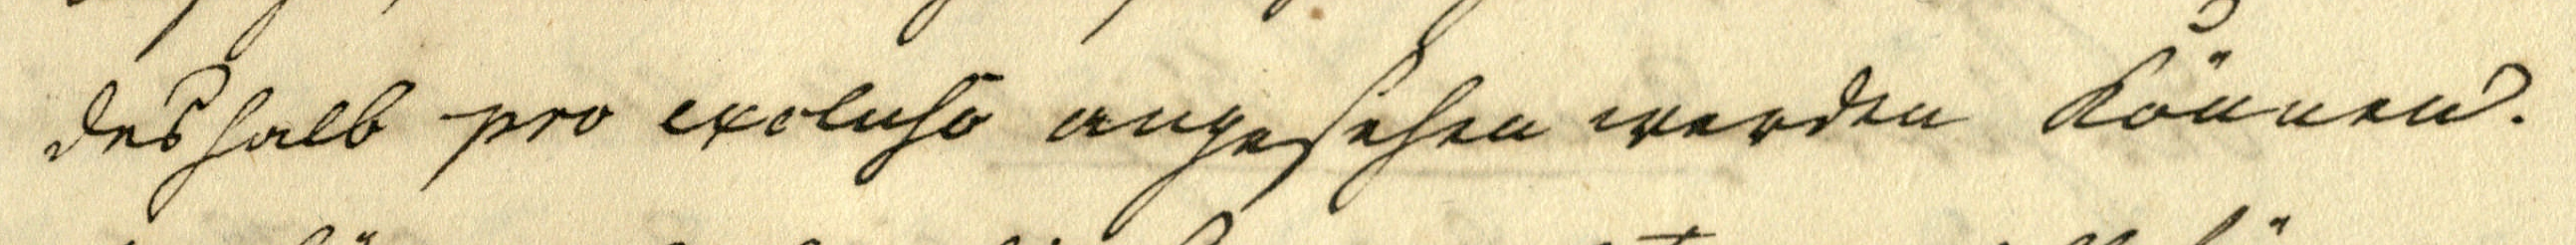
deshalb pro excluso angesehen werden können.
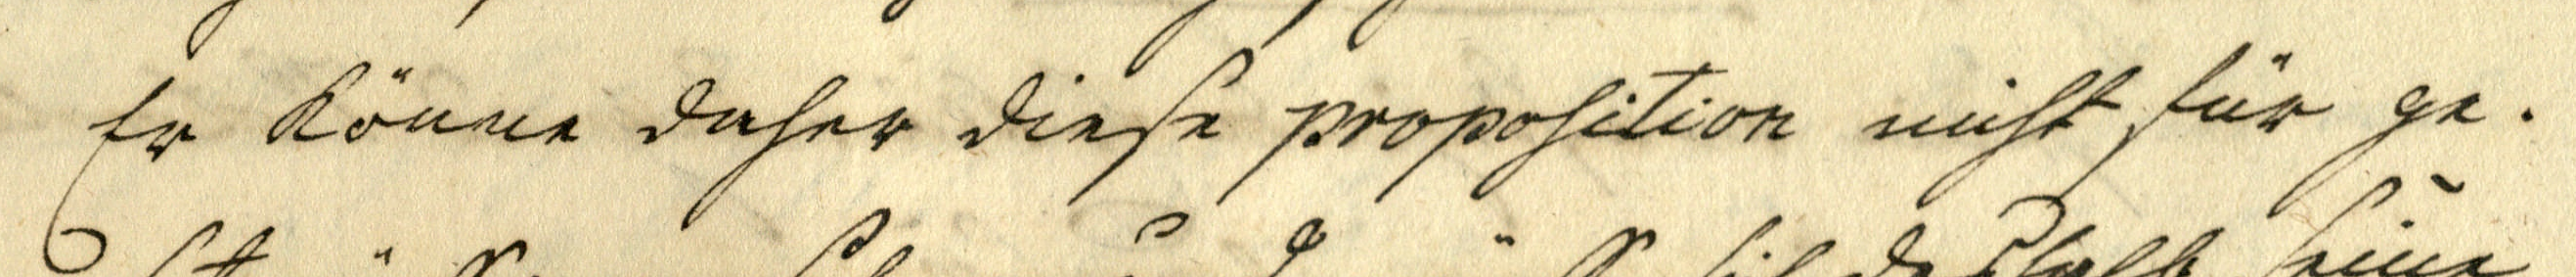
Er könne daher diese proposition nicht für ge-
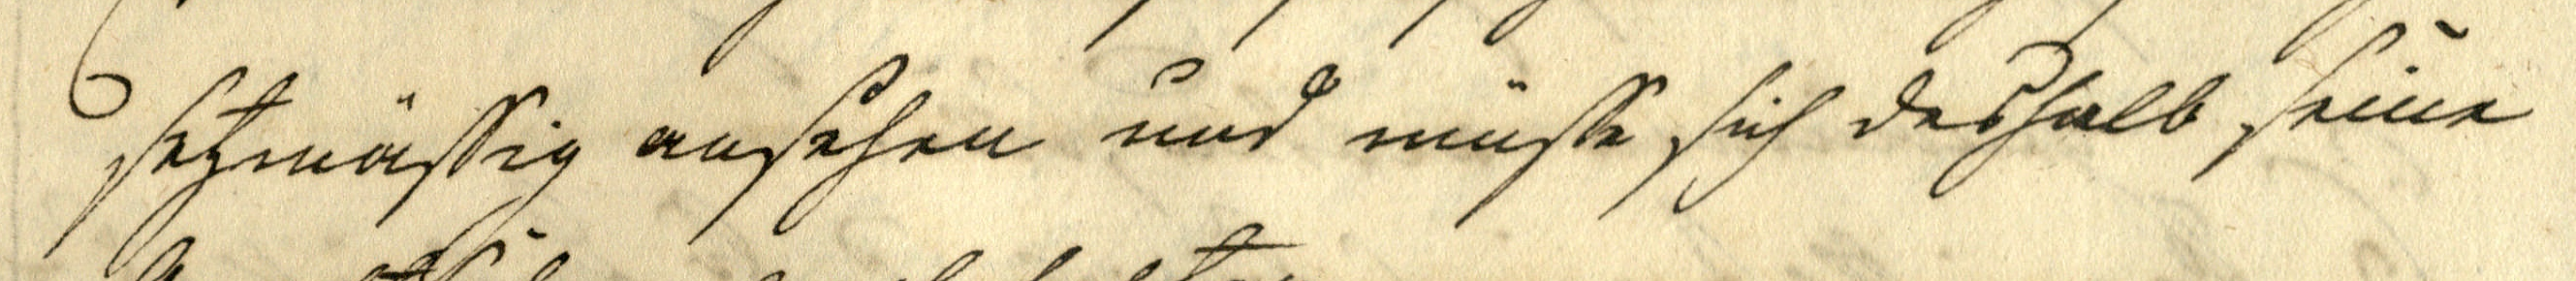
setzmässig ansehen und müsse sich deshalb seine
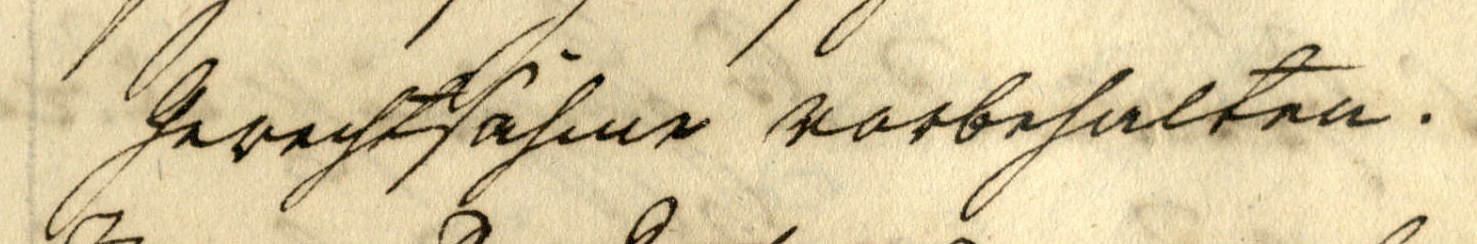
Gerechtsahme vorbehalten.
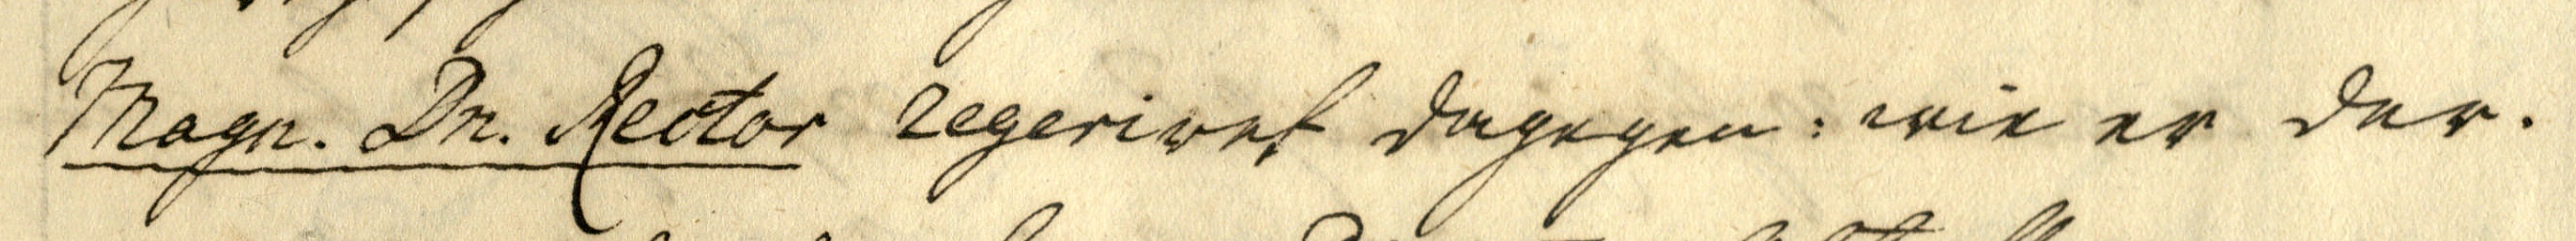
Magn. Dn. Rector regeriret dagegen: wie er dar-
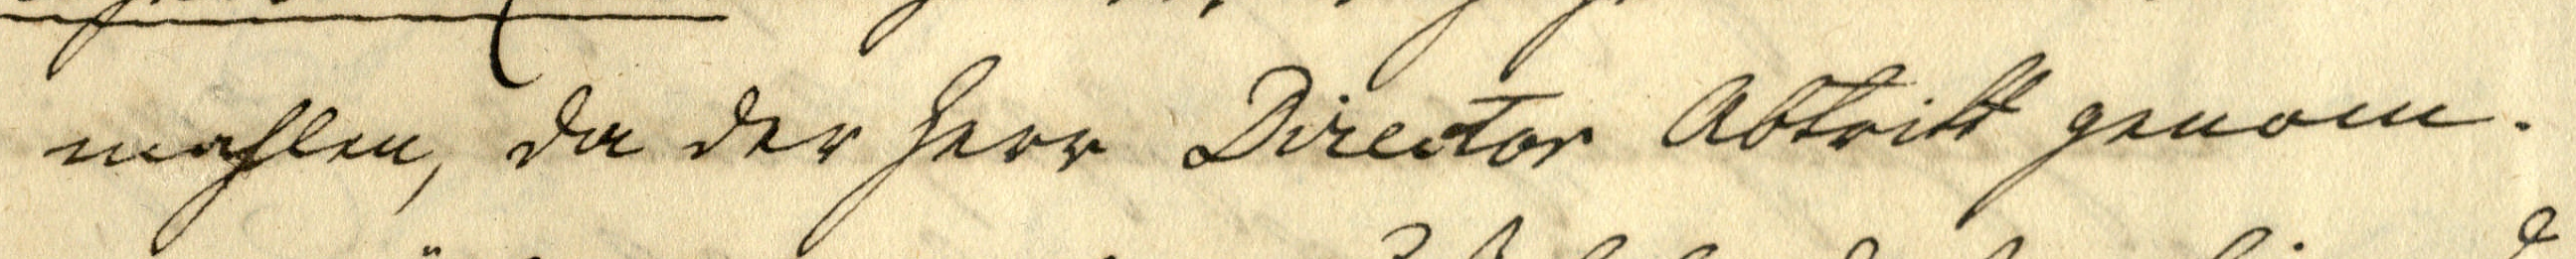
mahlen, da der Herr Director Abtritt genom-
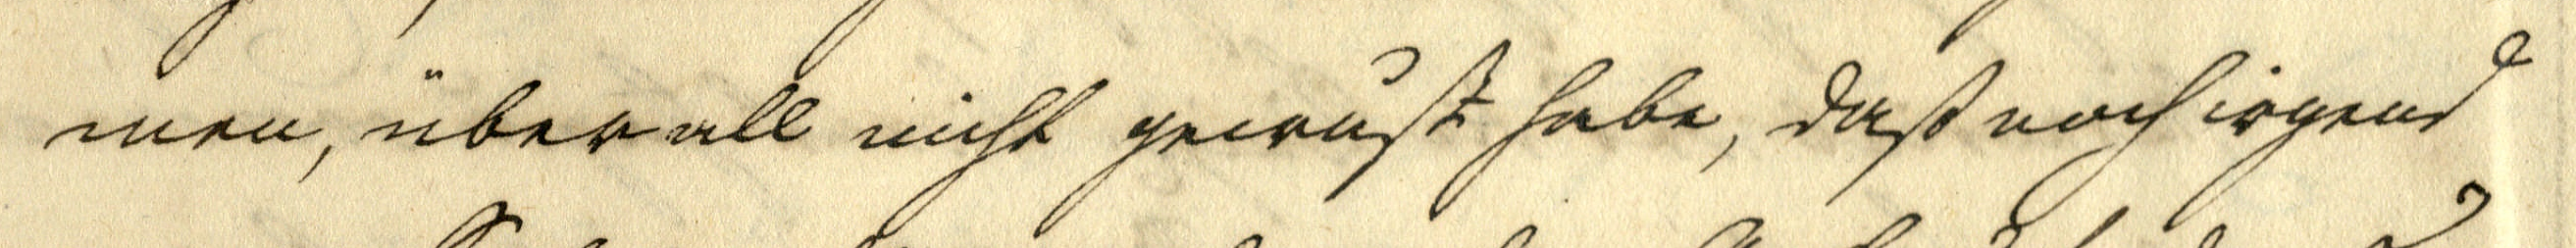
men, überall nicht gewußt habe, daß noch irgend
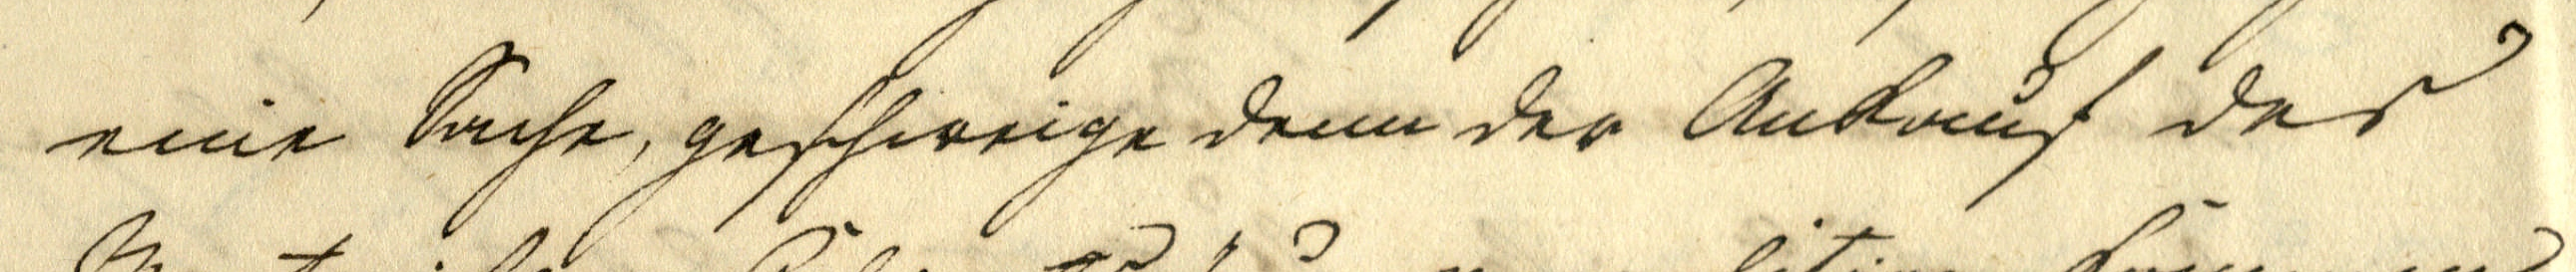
eine Sache, geschweige denn der Ankauf ds
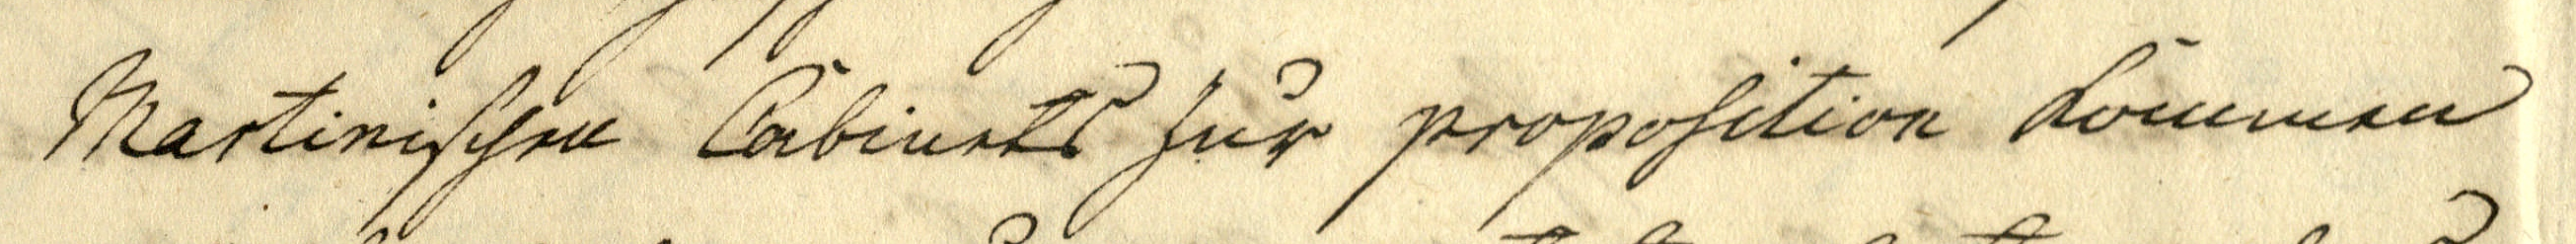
Martinischen Cabinets zur proposition kommen
